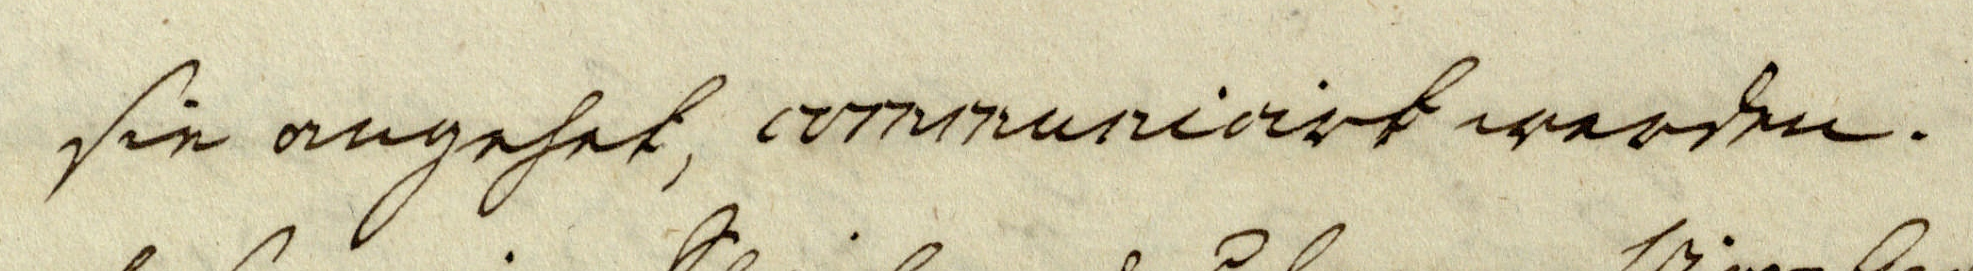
sie angehet, communicirt werden.
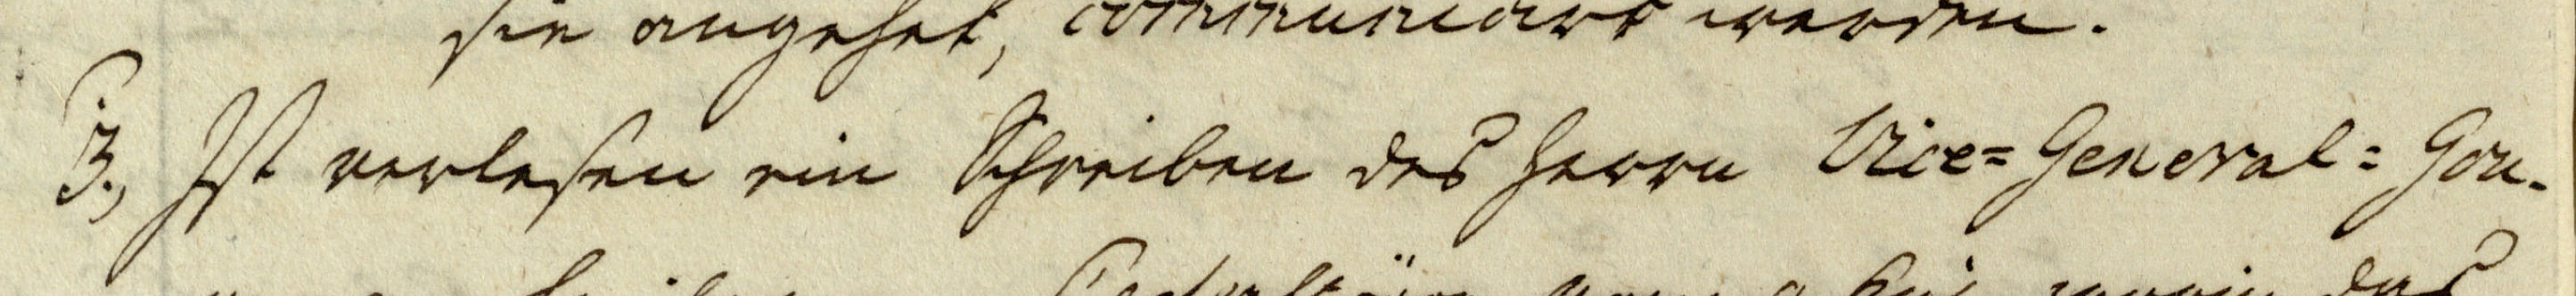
3., Ist verlesen ein Schreiben des Herrn Vice- General- Gou¬
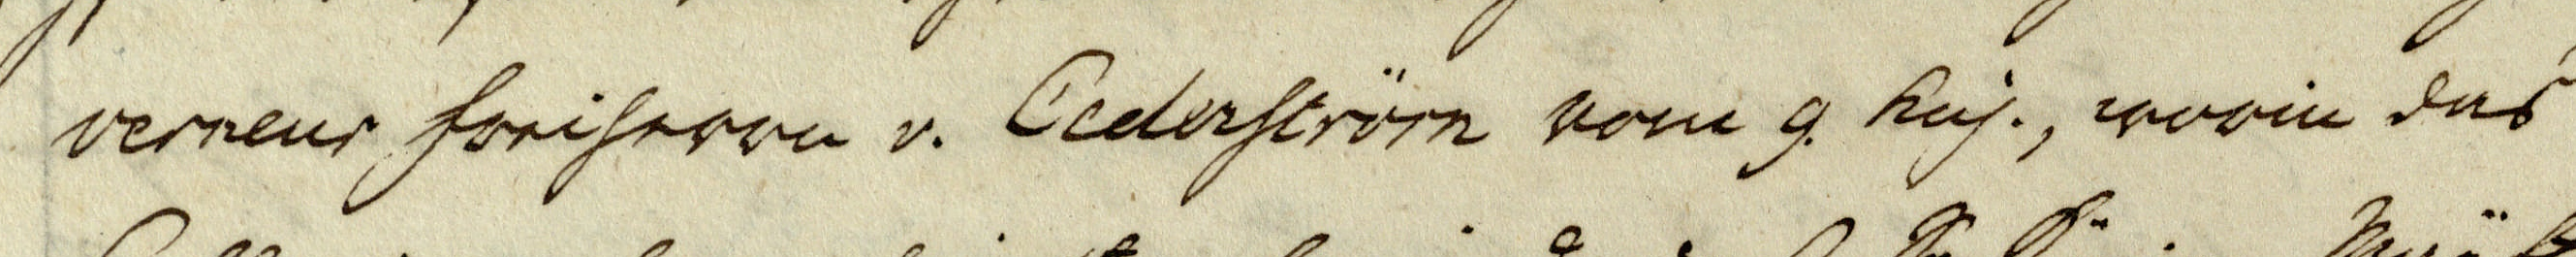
verneurs Freiherrn v. Cederström vom 9. huj., worin das
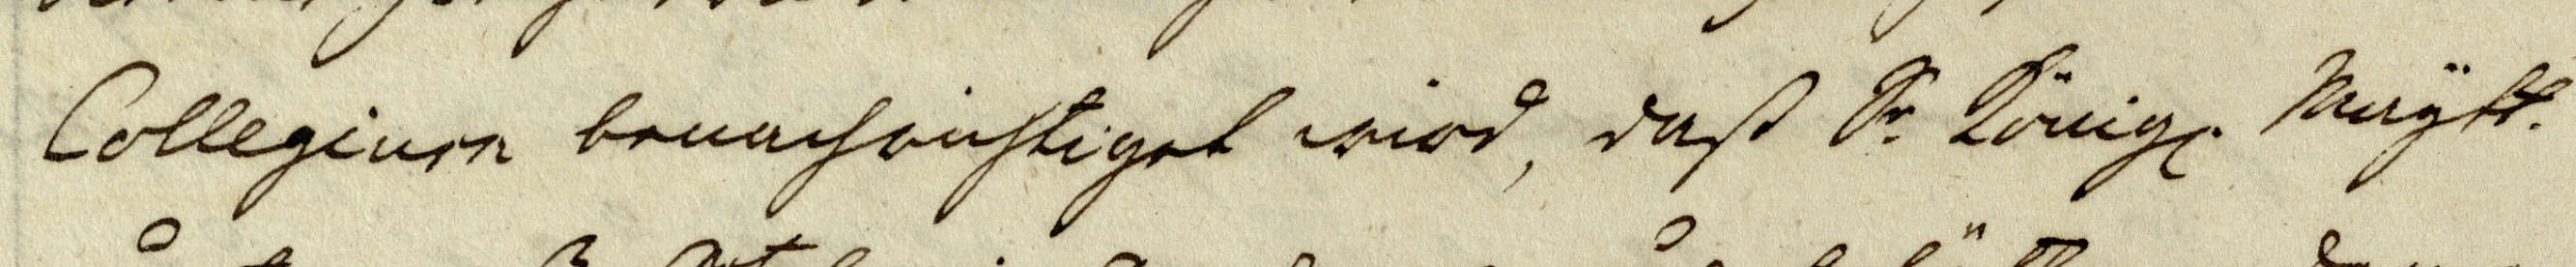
Collegium benachrichtiget wird, daß Sr. Königl. Maÿtt.
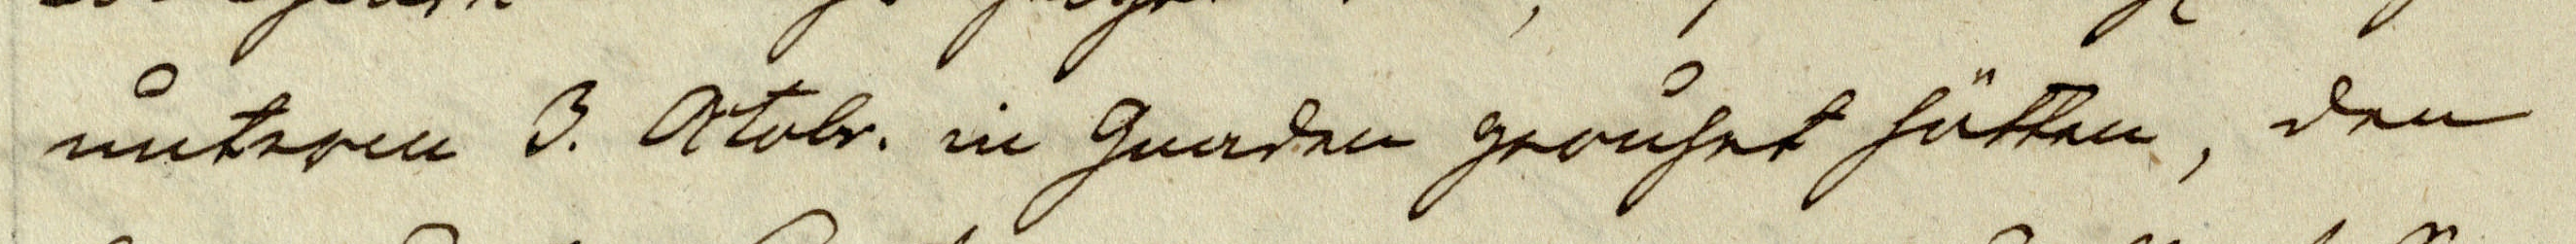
unterm 3. Octobr. in Gnaden geruhet hätten, den
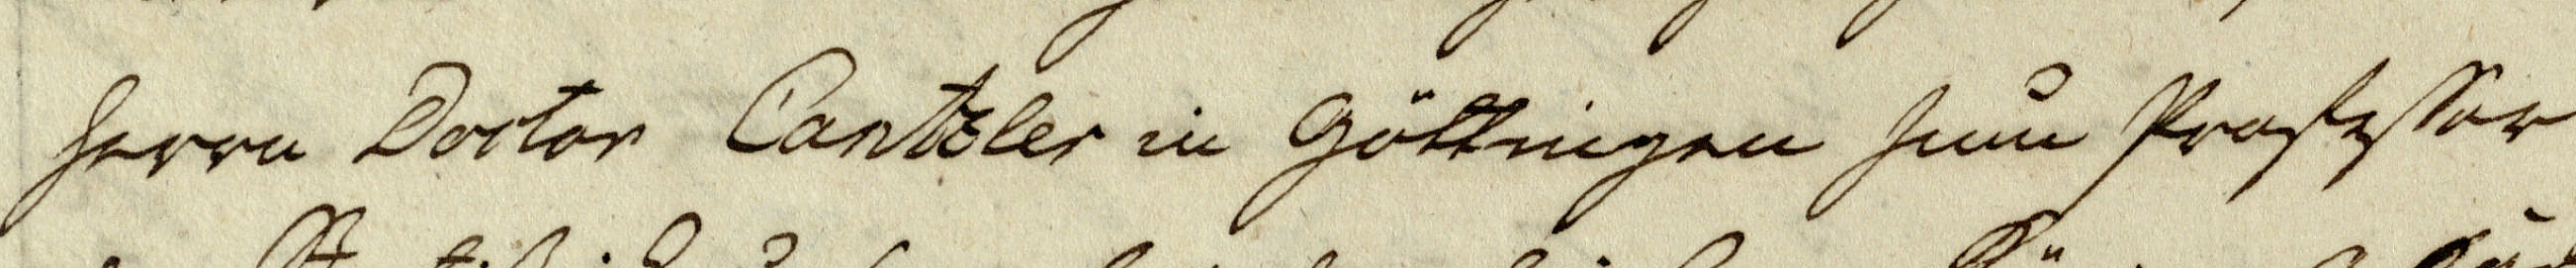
Herrn Doctor Cantzler in Göttingen zum Professor
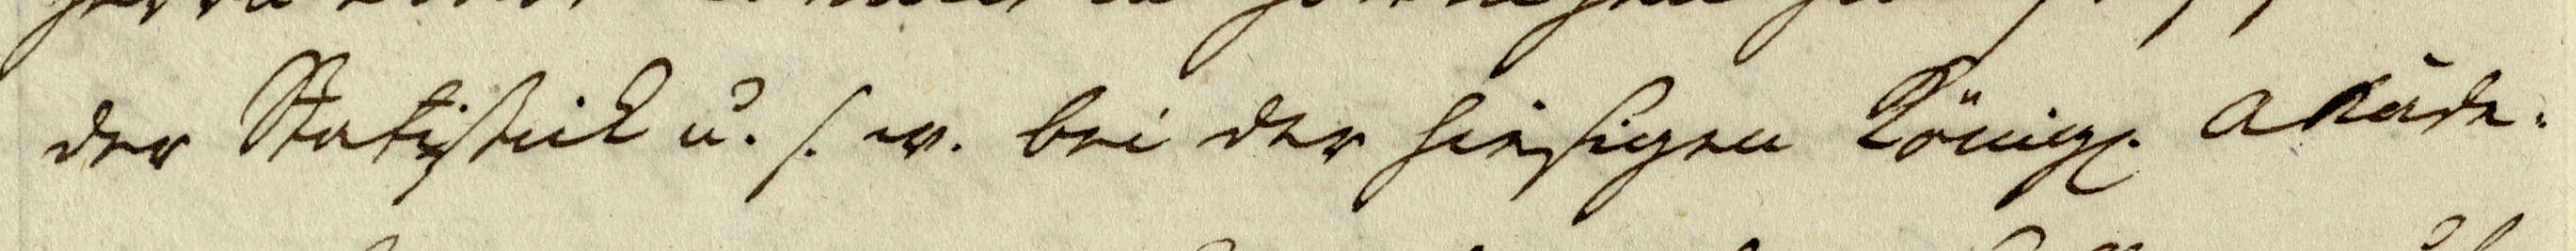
der Statistick u. s. w. bei der hiesigen Königl. Akade¬
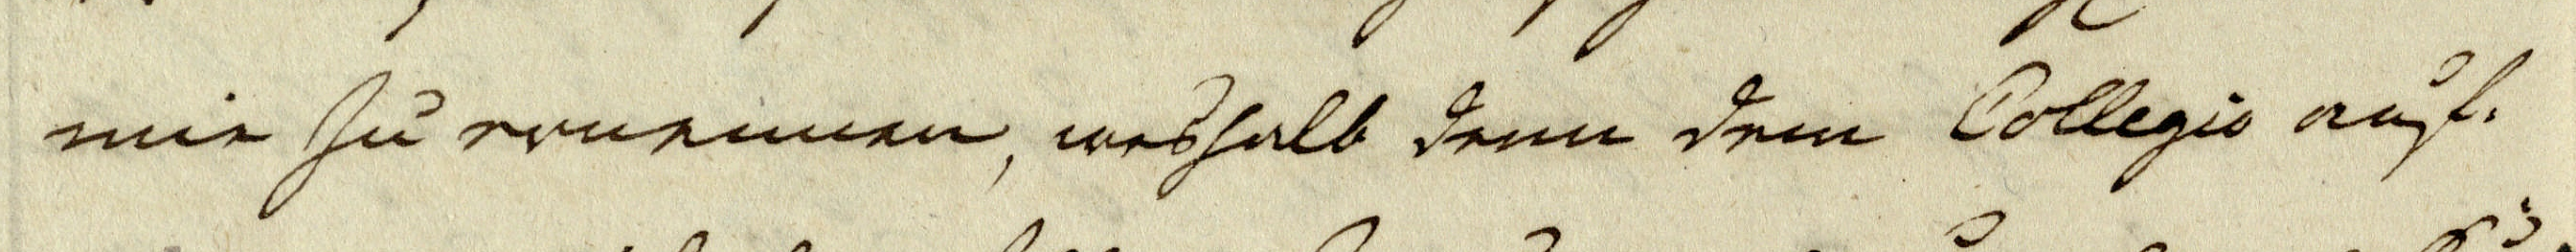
mie zu ernennen, weshalb denn dem Collegio auf¬
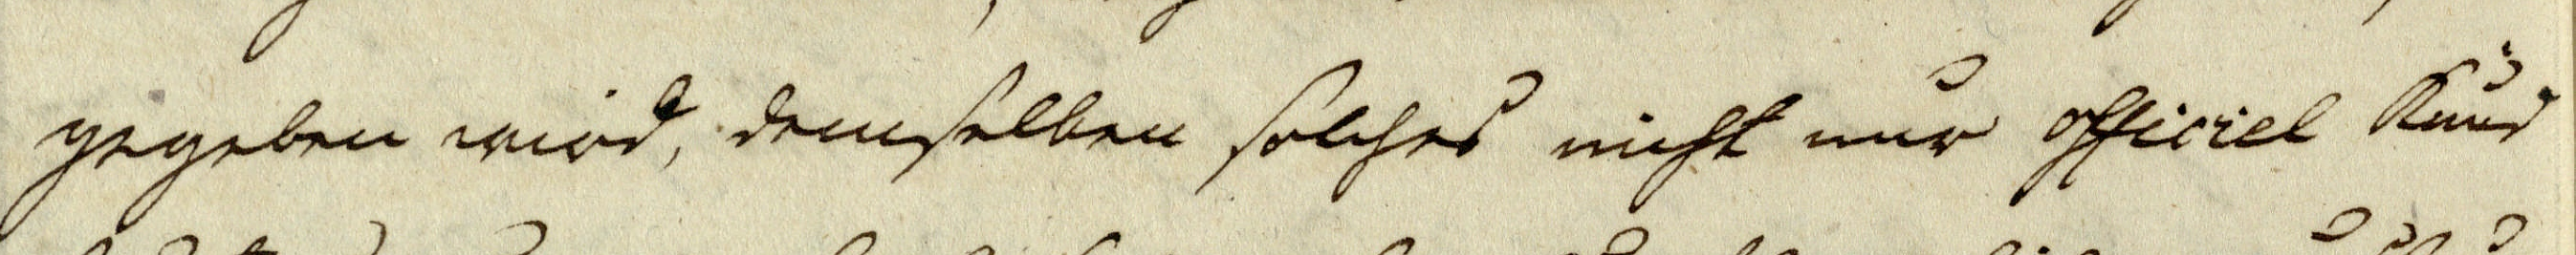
gegeben wird, demselben solches nicht nur officiel Kund
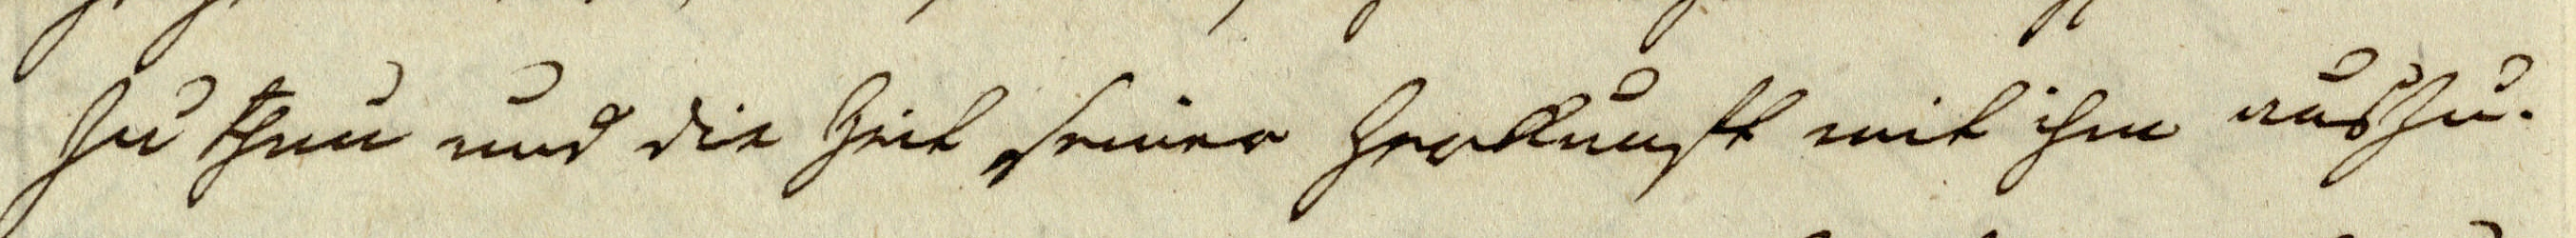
zu thun und die Zeit seiner Herkunft mit ihm auszu¬
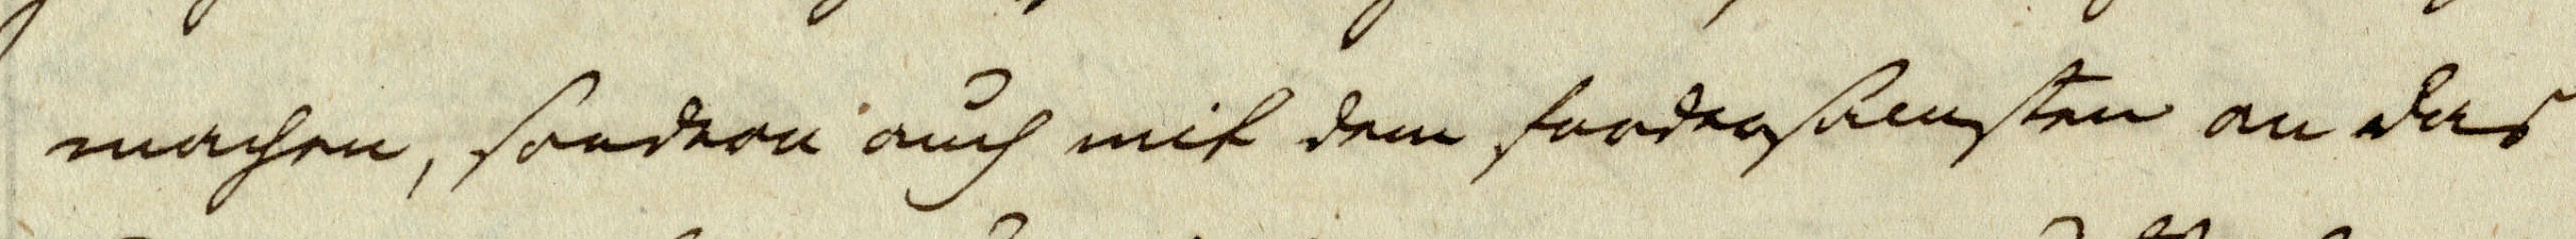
machen, sondern auch mit dem fordersamsten an das
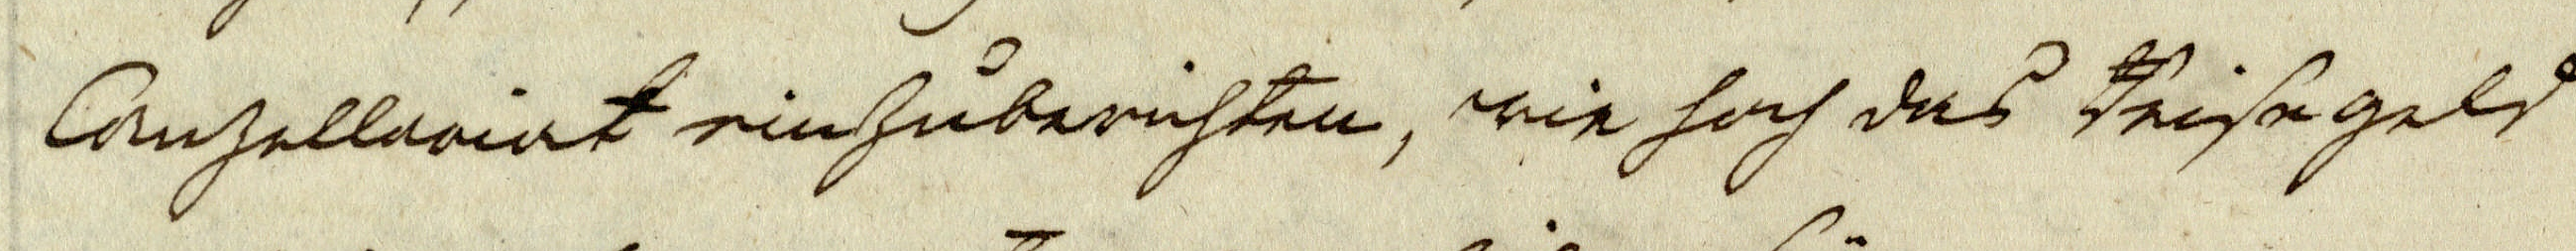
Canzellariat einzuberichten, wie hoch das Reisegeld
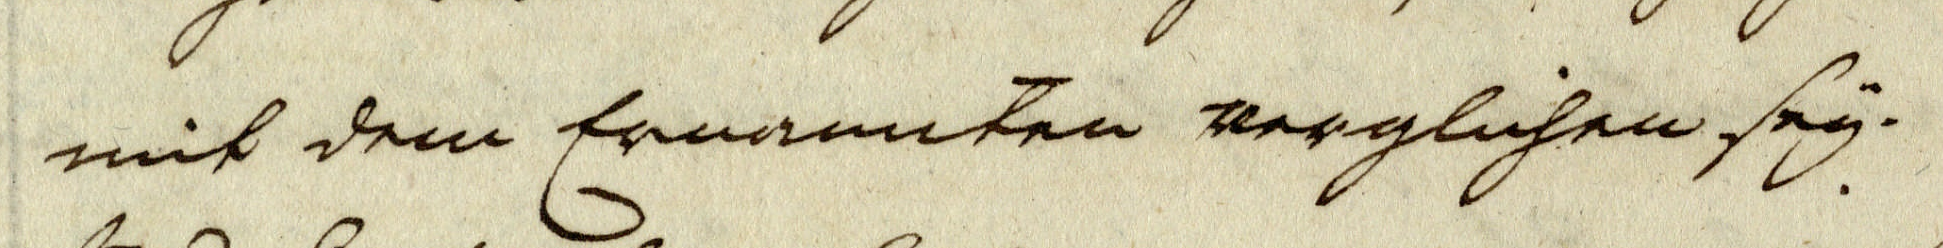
mit dem Ernannten verglichen seÿ.
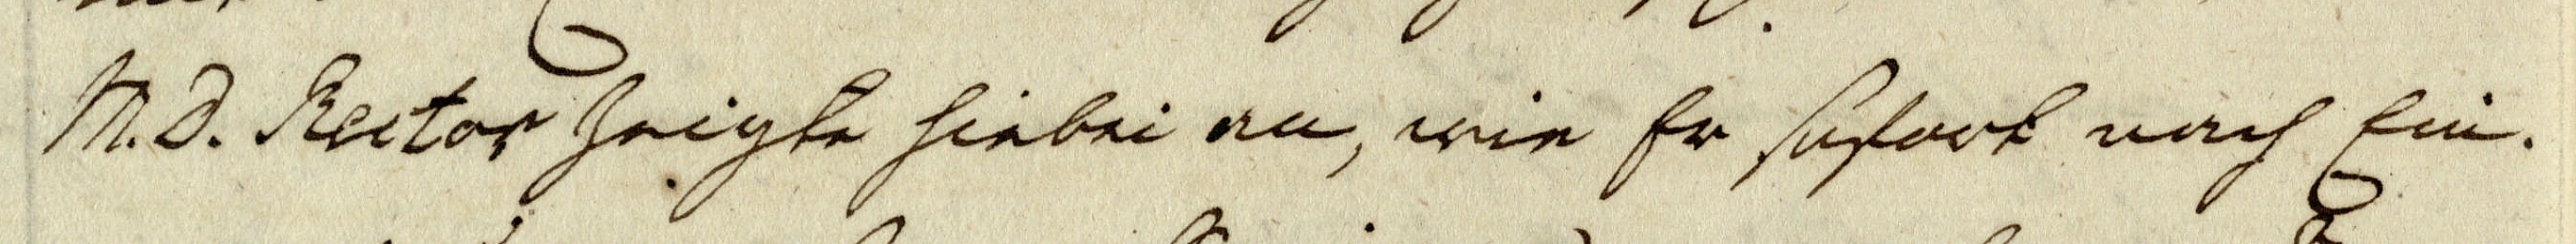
M. D. Rector zeigte hiebei an, wie Er sofort nach Ein¬
